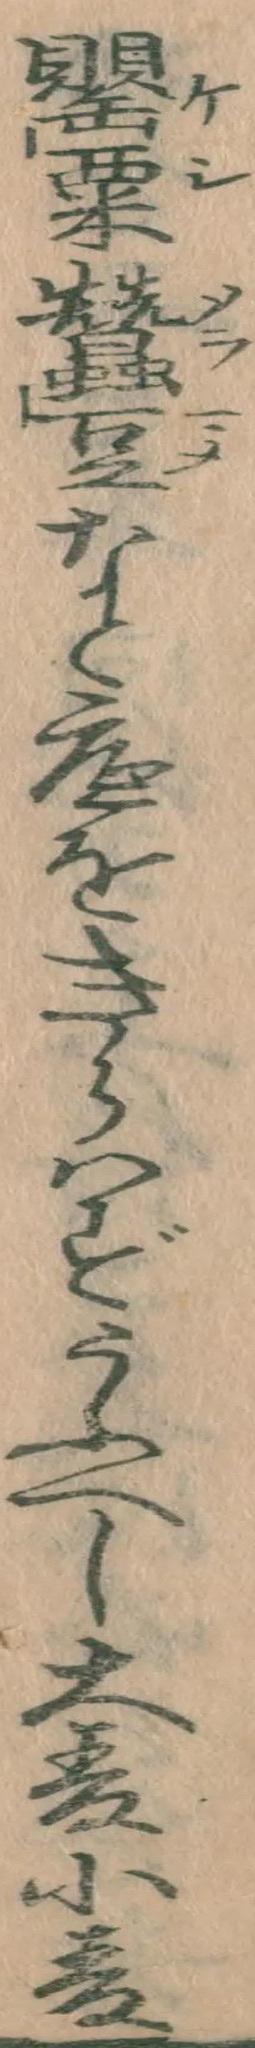罌-栗蠶-豆なと庭をきらはずうふへし大麦小麦
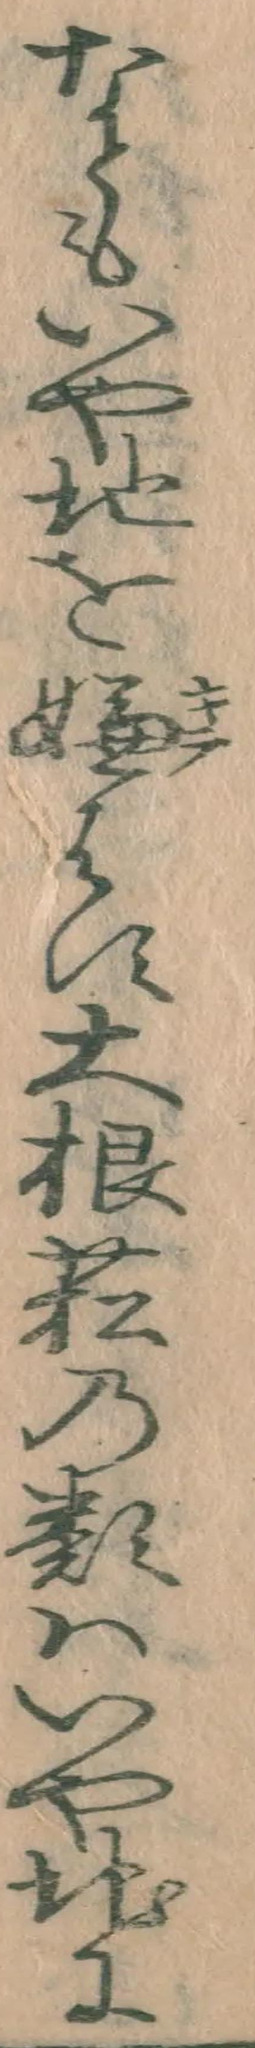なともいや地を嫌はす大根菘の類はいや地に
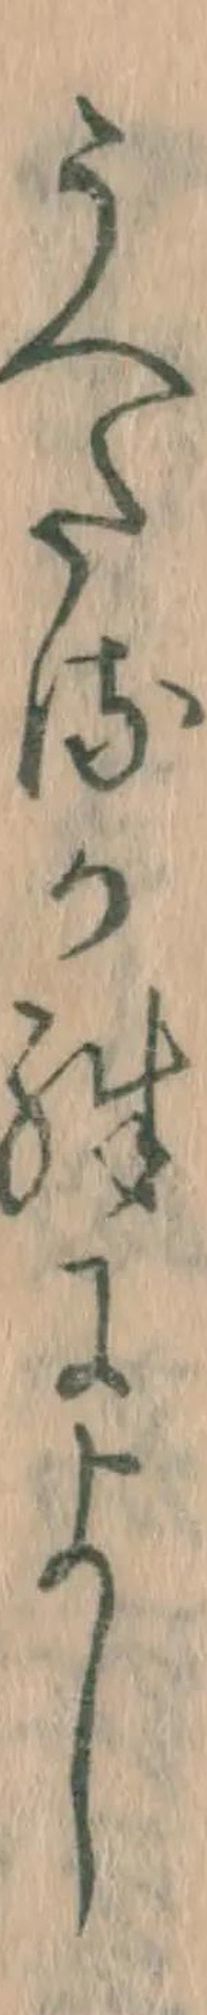うへたるか殊によし
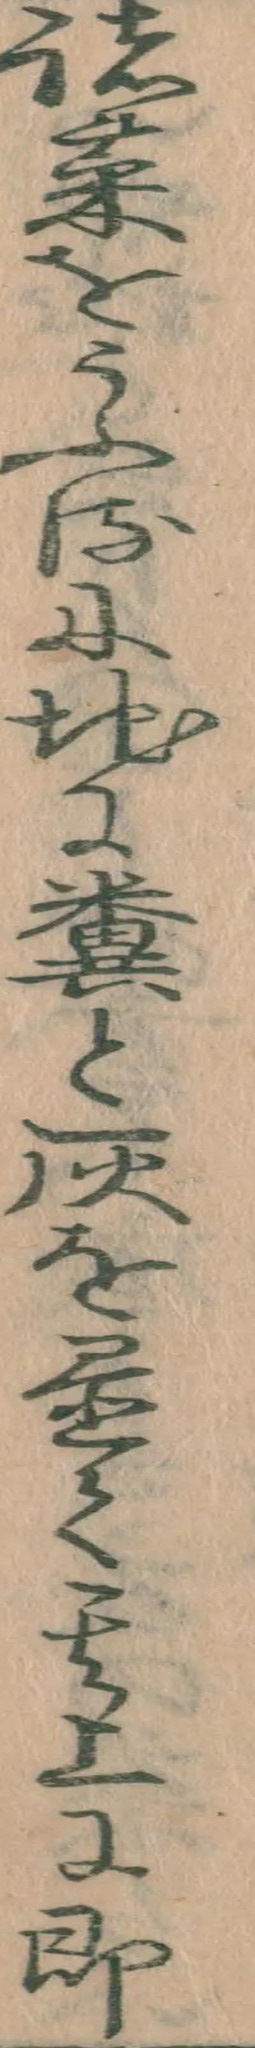諸菜をうふるに地に糞と灰を置て其上に即
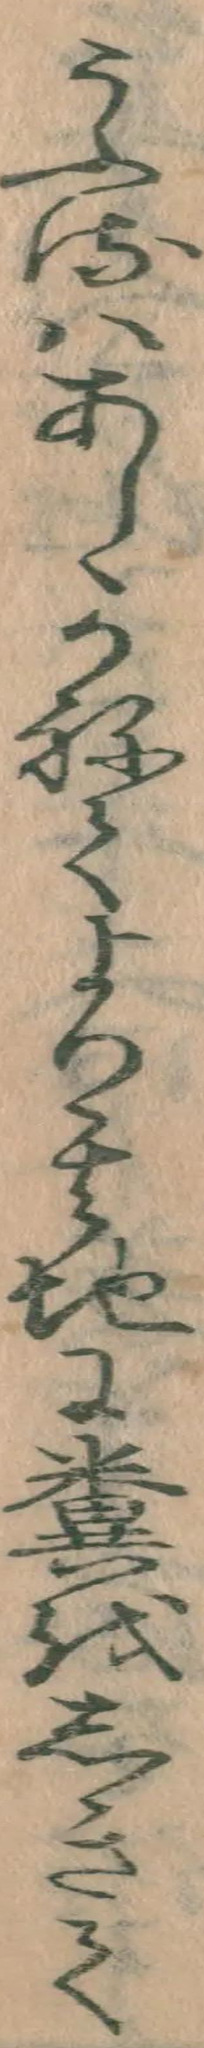うふるはあしくかねてより其地に糞をしきて
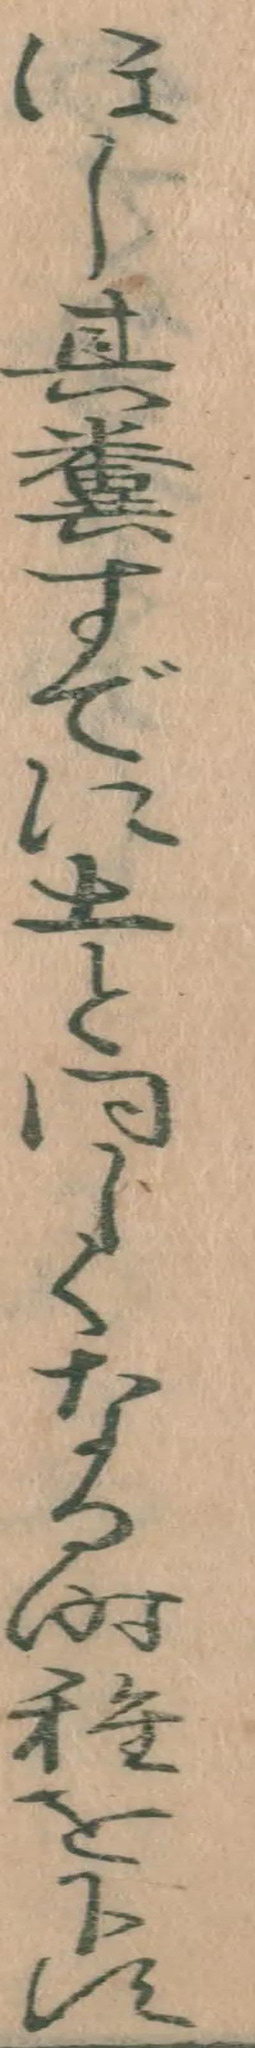ほし其糞すでに土と同しくなる時種を下す
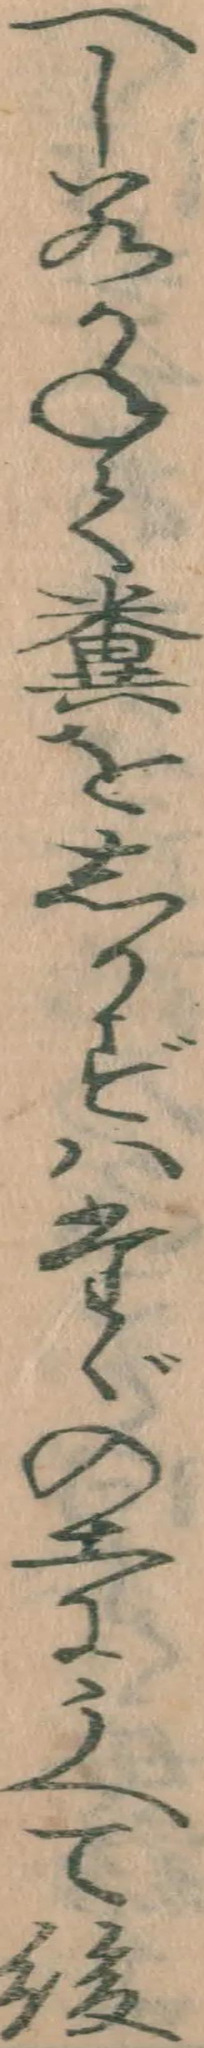へし若かねて糞をしかずはたゞの土にうへての後
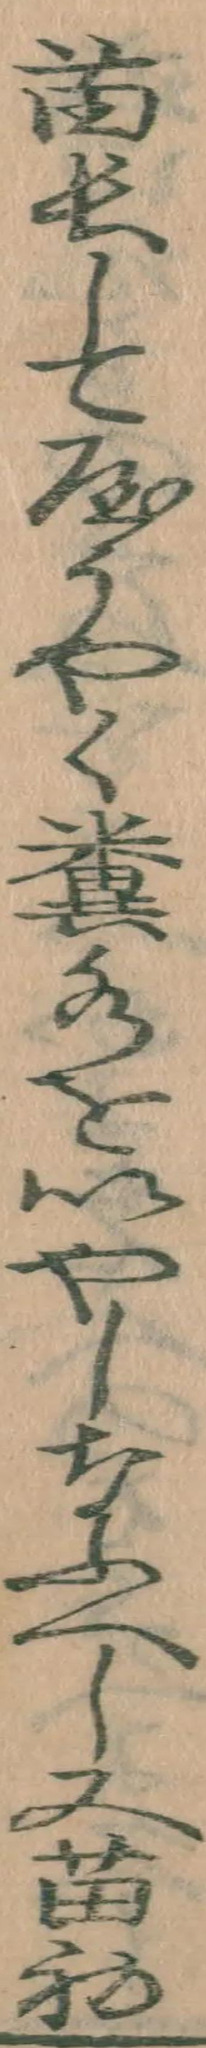苗長してやうやく糞水を以やしなふし又苗初
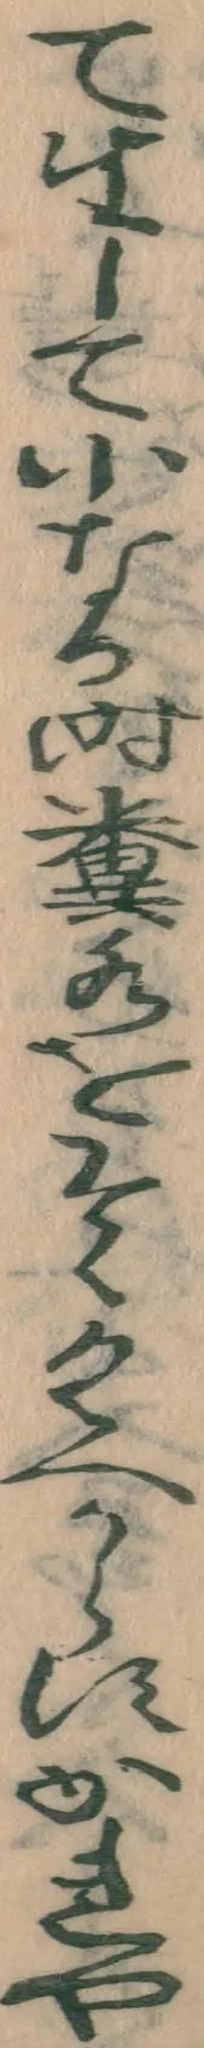て生して小なる時糞水をそゝくへからすかれや
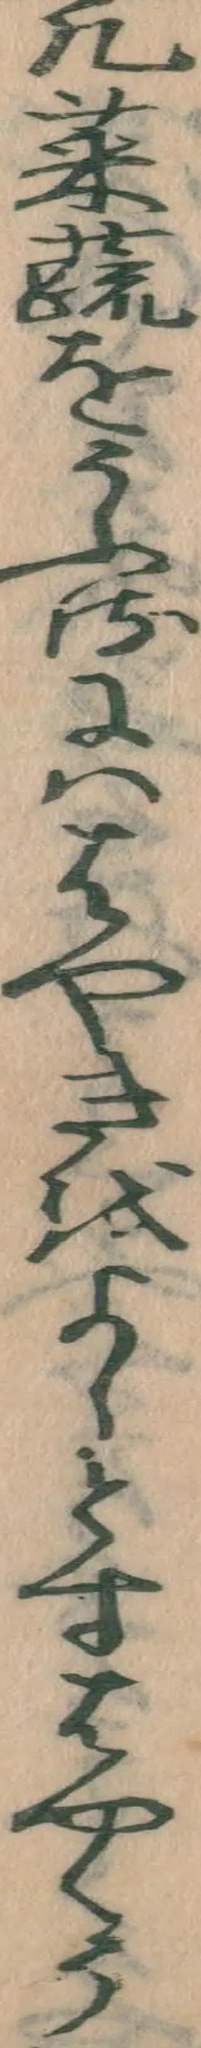凡蔬菜をうふるにははやきをよしとすはやくう
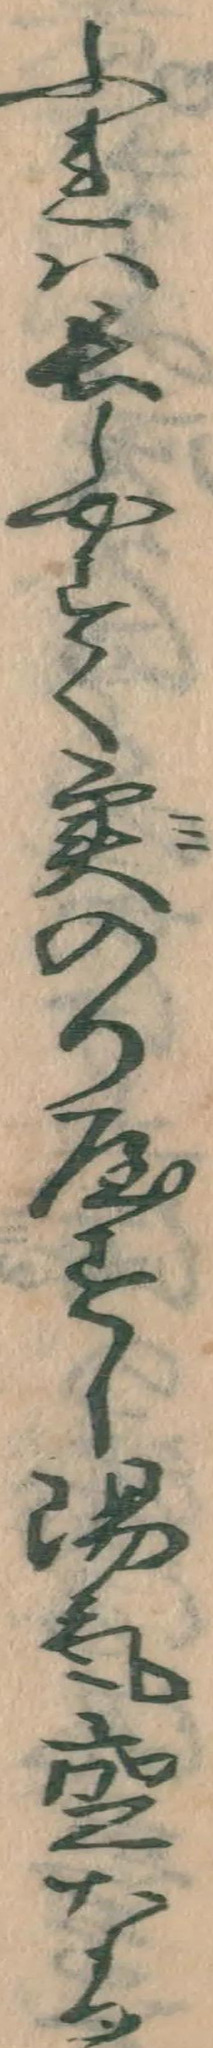ふれは長しやすく実のりやすく陽気盛なる
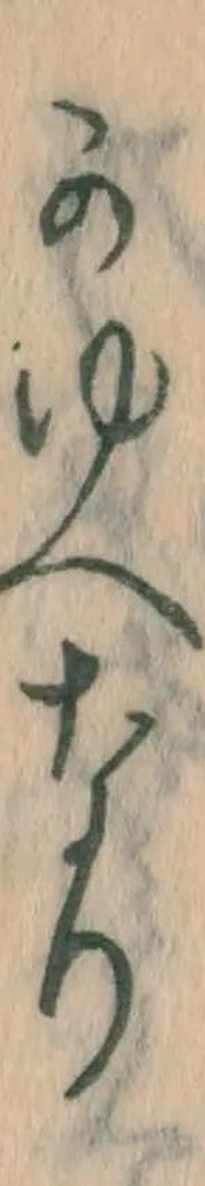かゆへなり
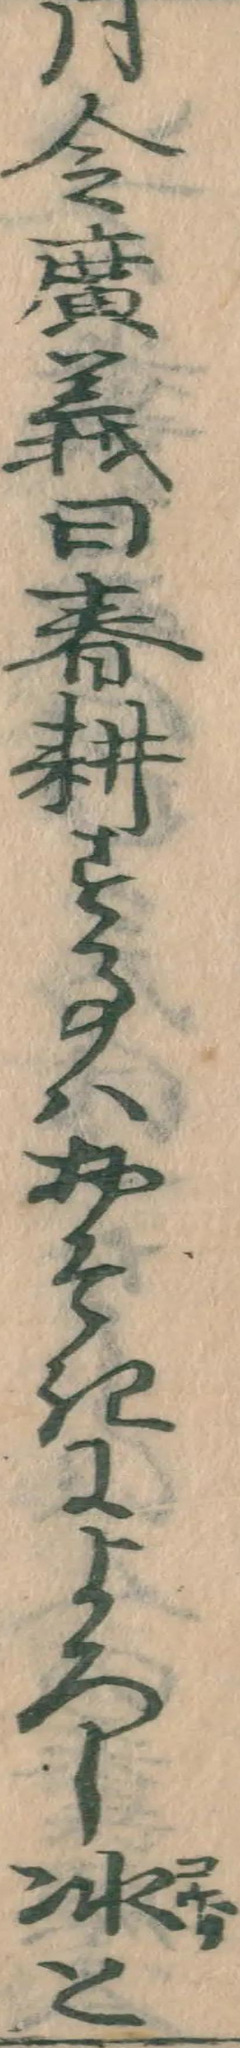月令広義曰春耕するはおよそきによろし冰と
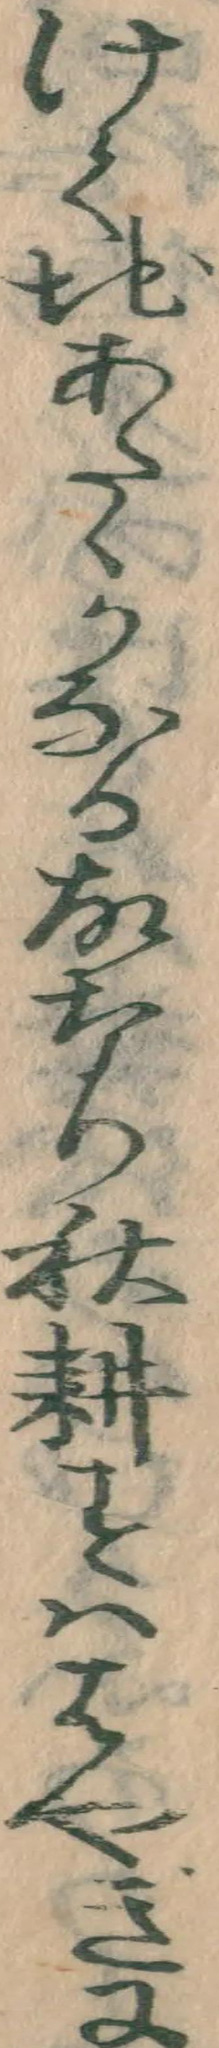けて地あたゝかなる故なり秋耕すははやきに
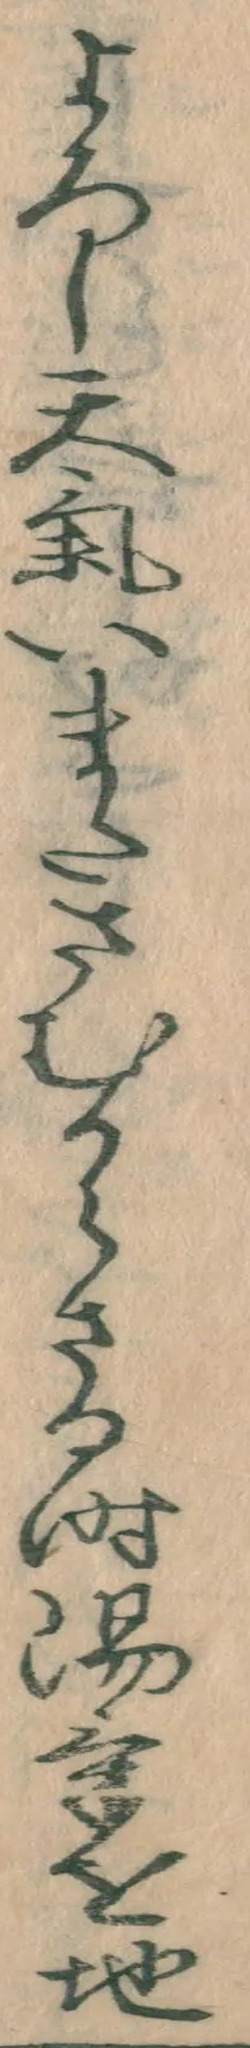よろし天気いまたさむからさる時湯気を地
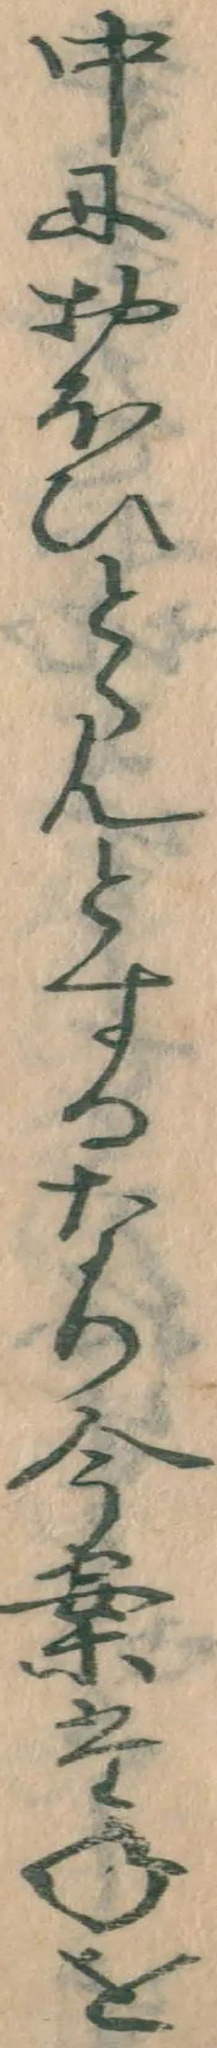中におほひとらんとするなり今案たねを
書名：菜譜 3巻
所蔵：国立国会図書館 National Diet Library, JAPAN
